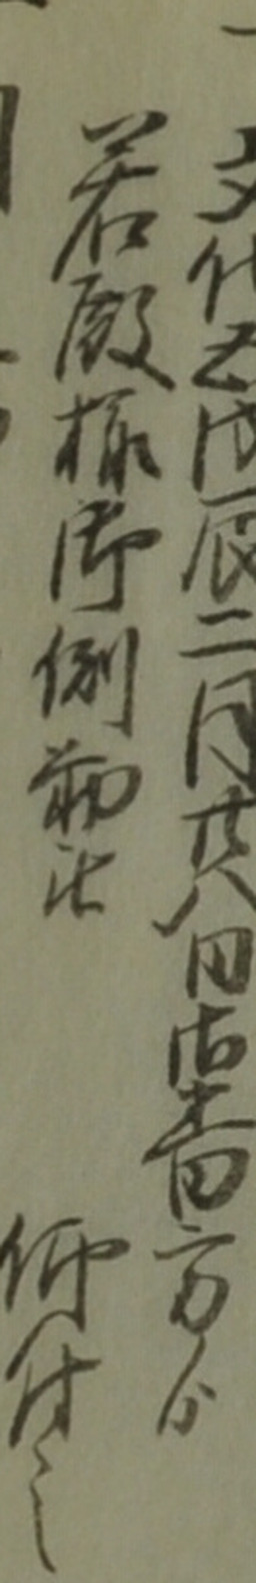若殿様御側勤被仰付之
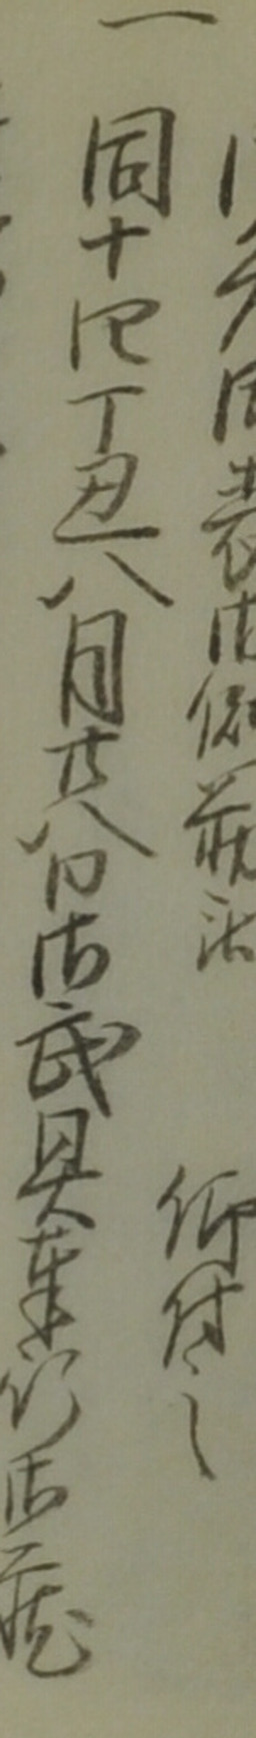一同十四丁丑八月八日御武具奉行御蔵
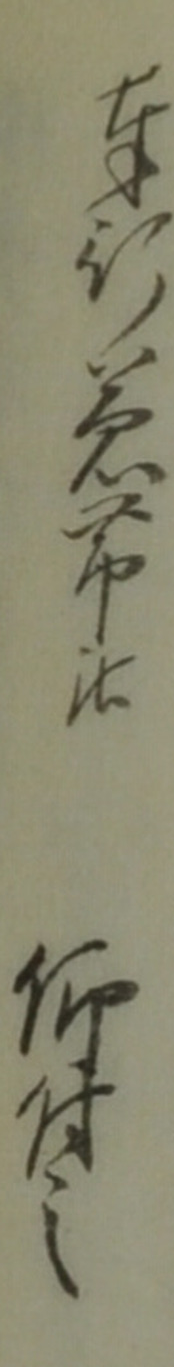奉行兼帯被仰付之
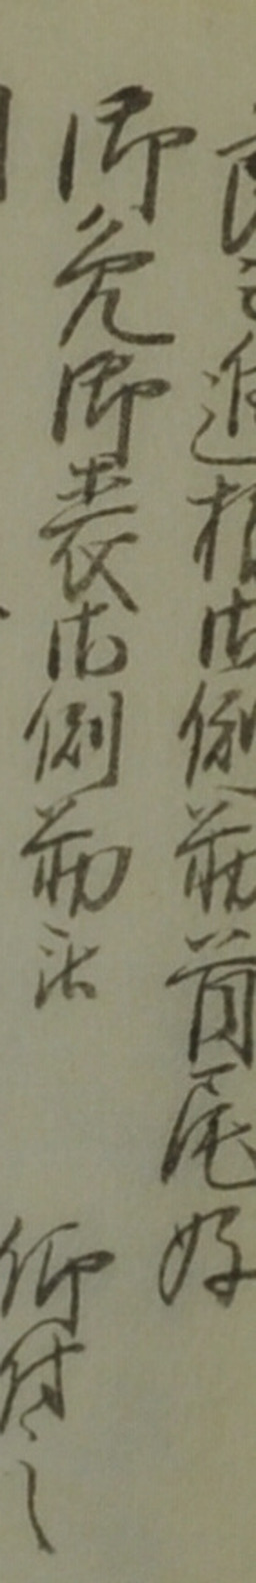御免御表御側勤被仰付之
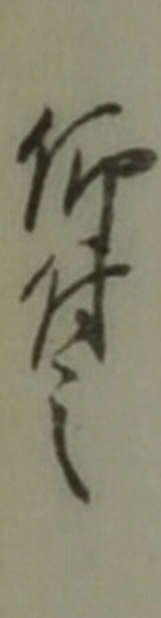仰付之
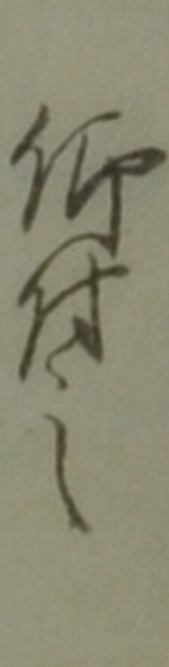仰付之
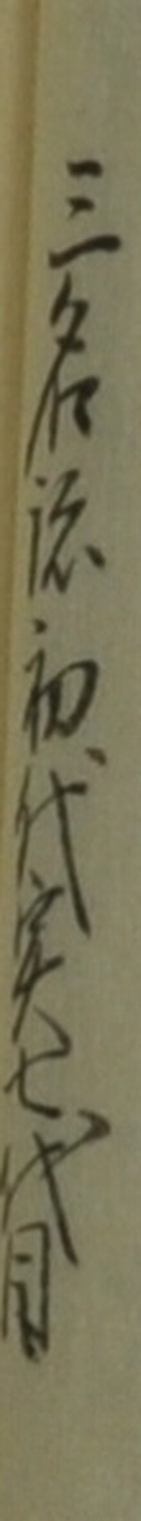三名跡初代実七代目
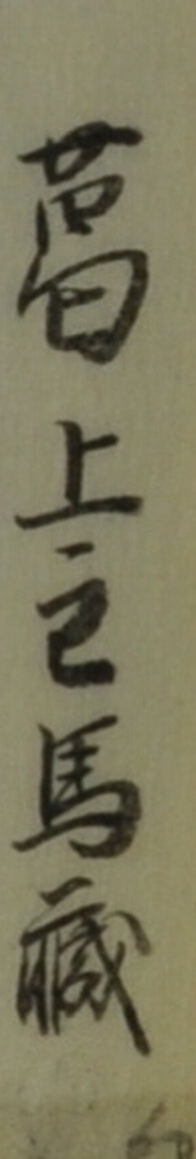葛上主馬蔵
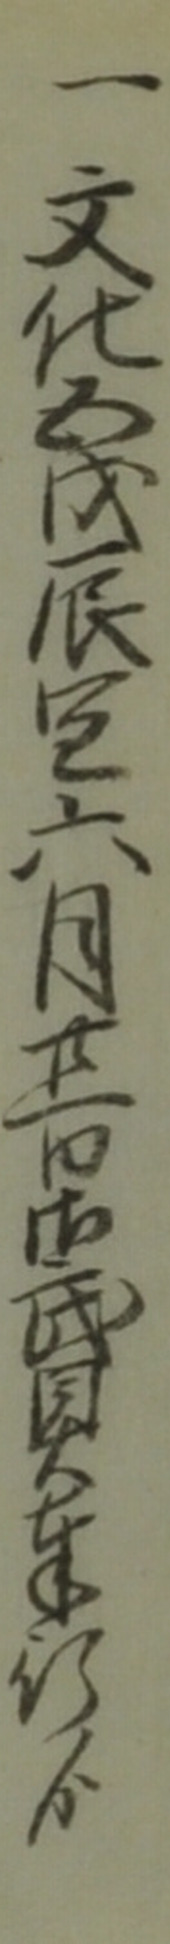一文化五戊辰閏六月廿一日御武具奉行ゟ
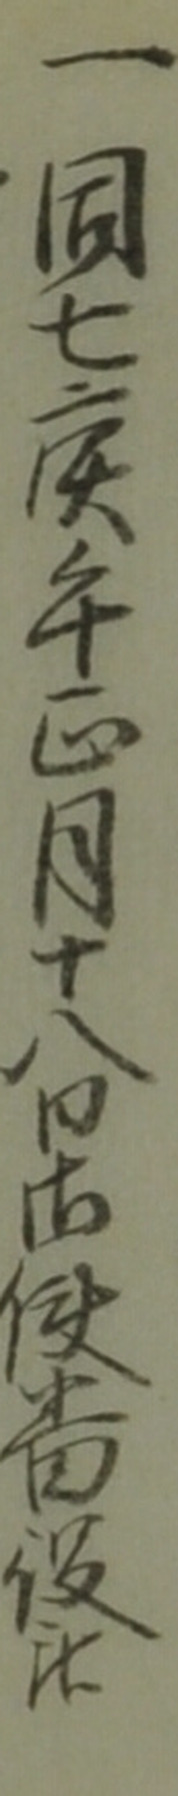一同七庚午正月十八日御使番役被
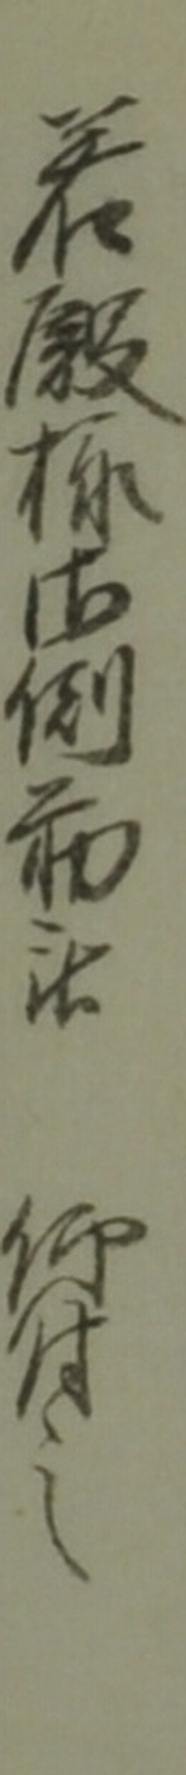若殿様御側勤被仰付之
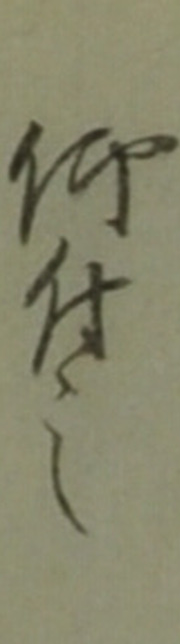仰付之
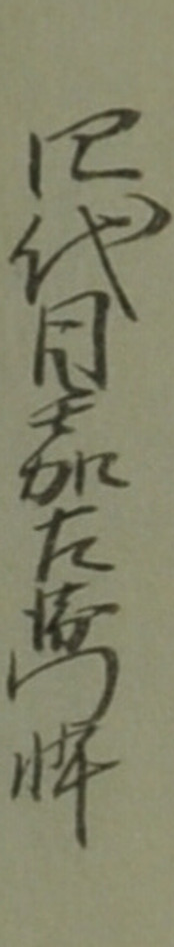四代目嘉左衛門忰
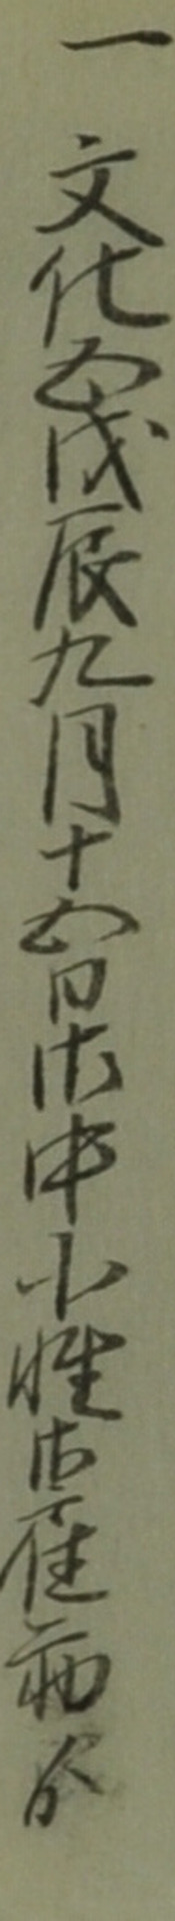一文化五戊辰九月十五日御中小性御雇勤
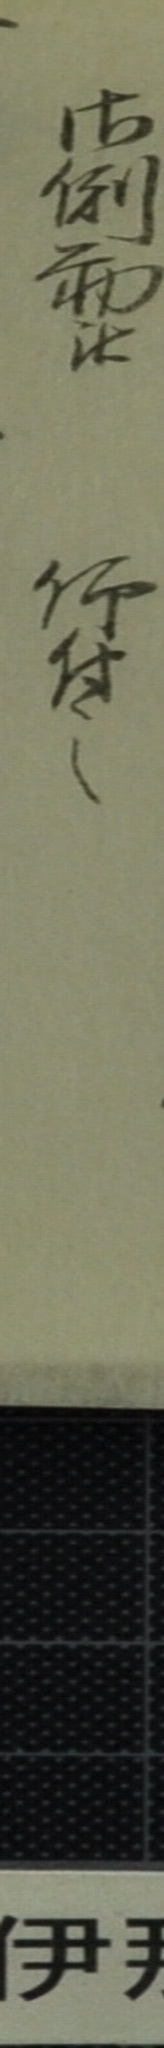御側勤被仰付之
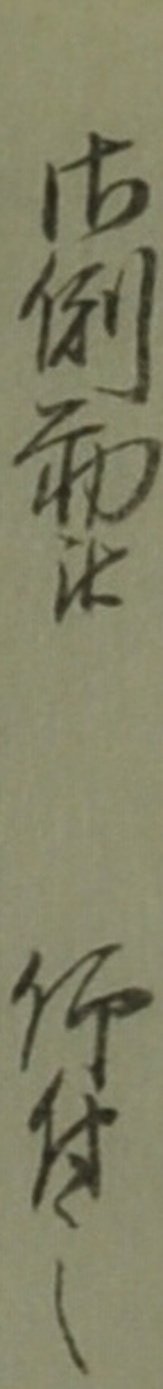御側勤被仰付之
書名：諸御役代々録（五）
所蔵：伊那市立高遠町図書館・合同会社AMANE
